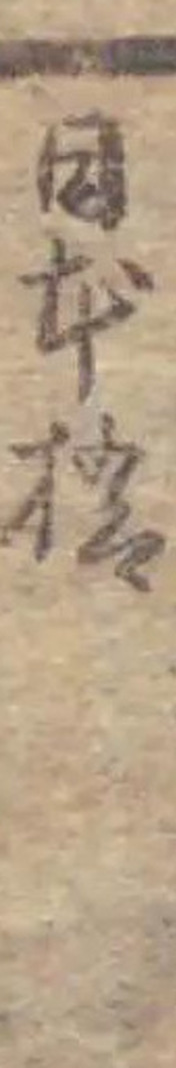日本橋
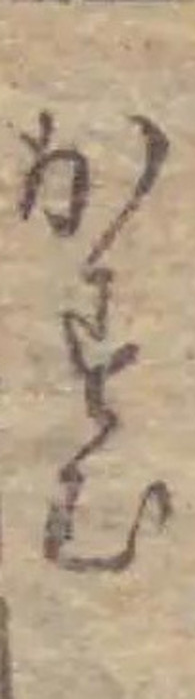かすむ
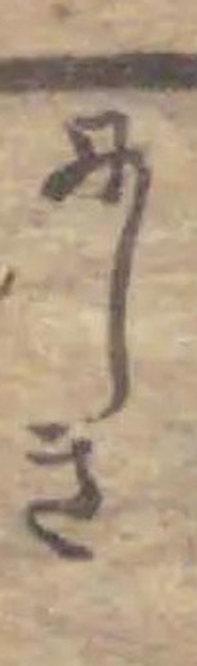にしき

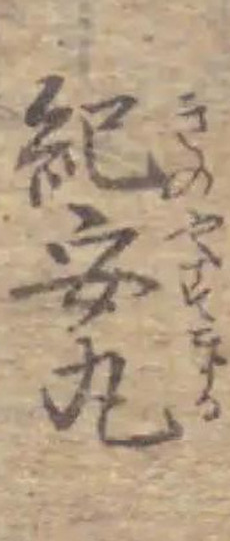紀安丸
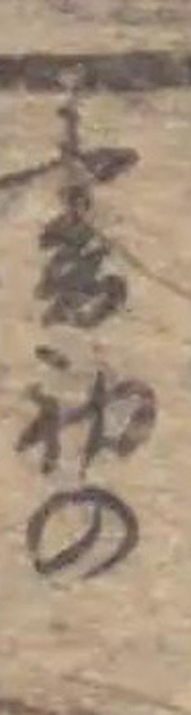書初の
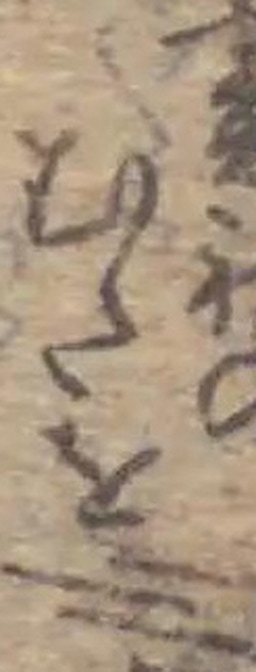むたを
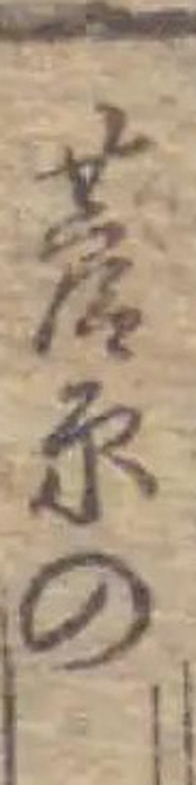菅原の
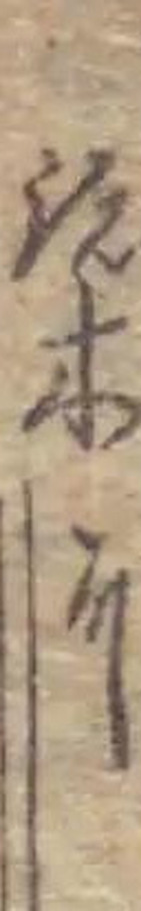諸木に
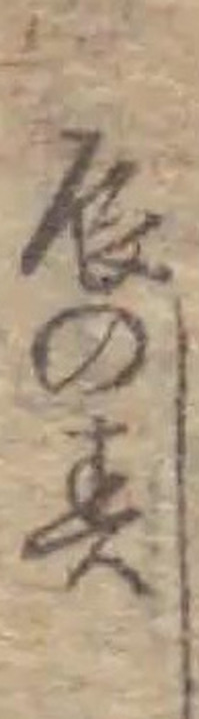辰の春
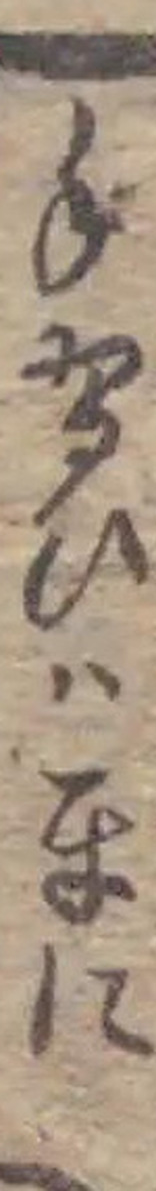手習ひは互に
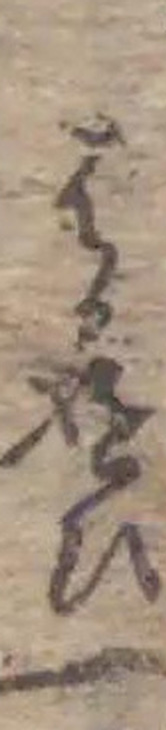はる遊ひ
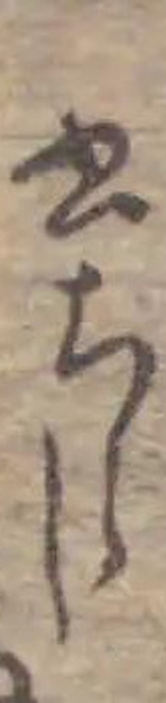書ちら
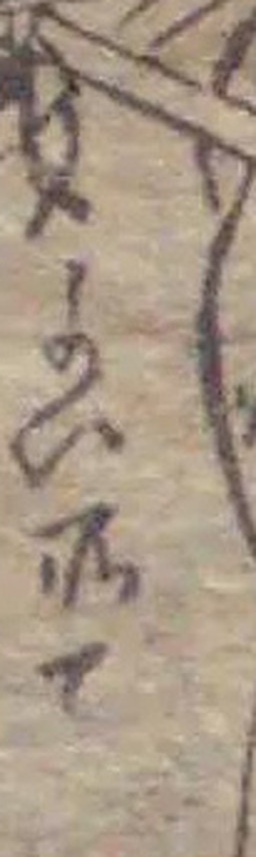よい所て
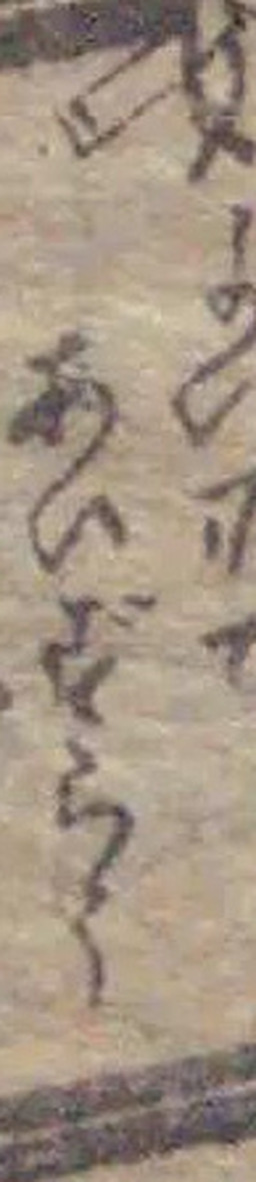あいぞらう

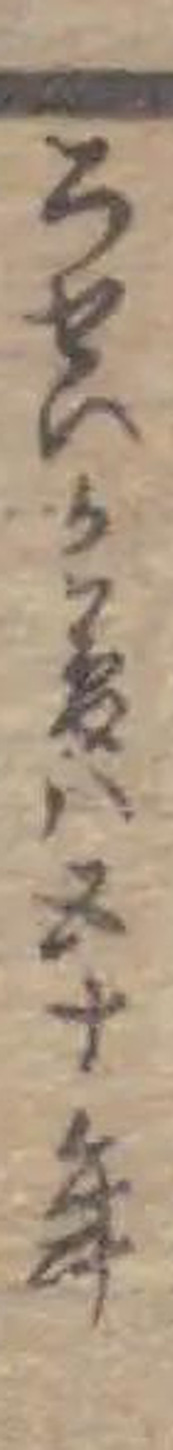ろせいか夢は五十年
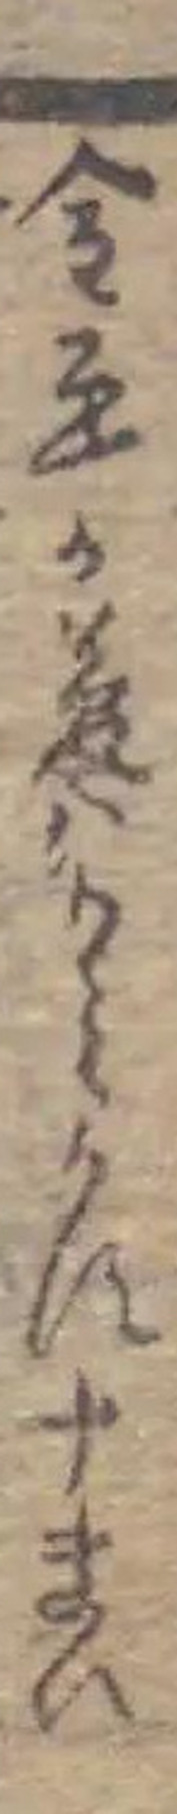金平か夢はかみかす十まい
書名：金平子供遊 2巻
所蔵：国立国会図書館 National Diet Library, JAPAN
